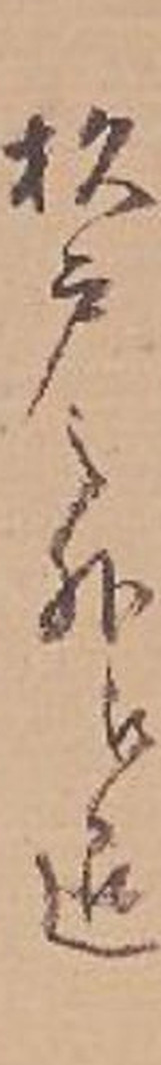杉戸之外え退
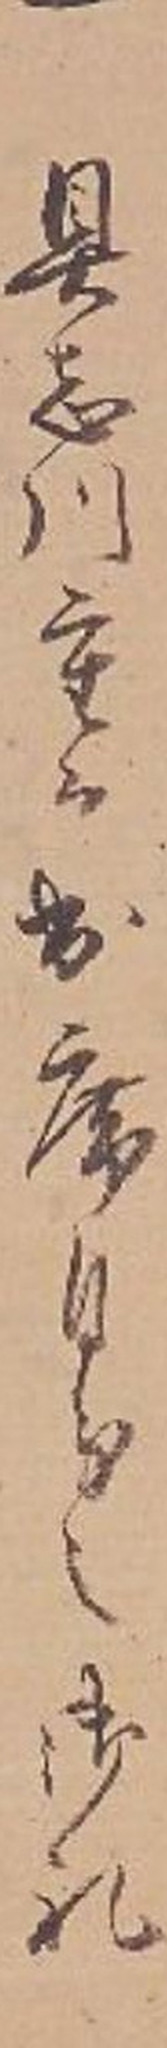一具志川重而出席自分之御礼
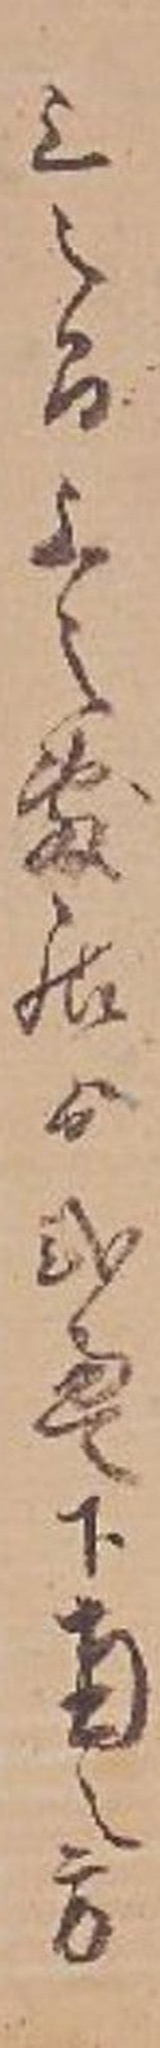三之間上之敷居ゟ弐畳下南之方
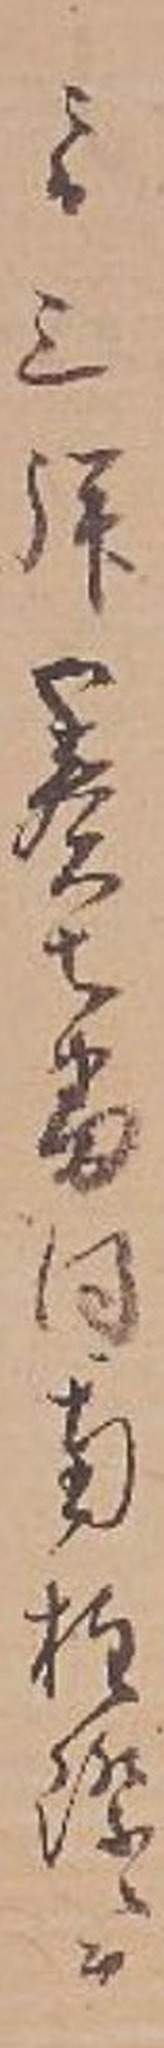に而三拝御奏者番同南柱際に而

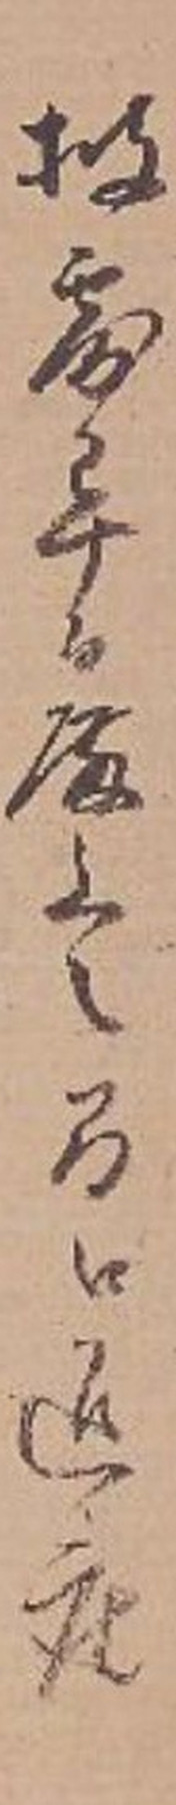披露畢而殿上之間え退座
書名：琉球人来朝記 五、六、七
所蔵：University of the Ryukyus Library
